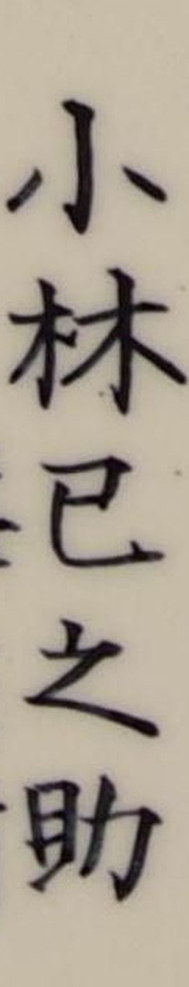小林巳之助
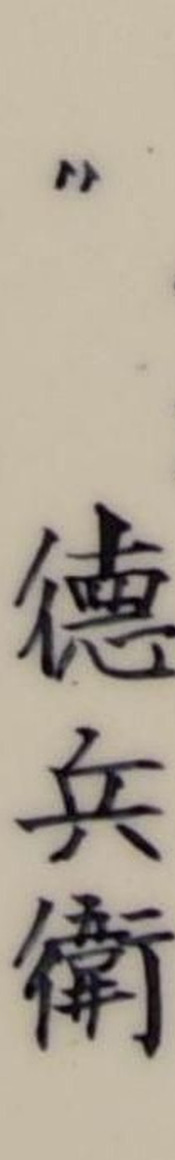徳兵衛
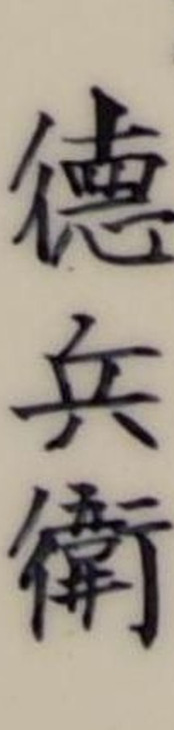徳兵衛
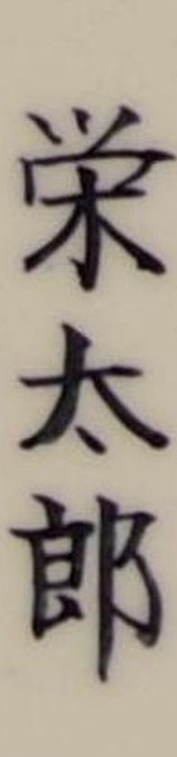栄太郎
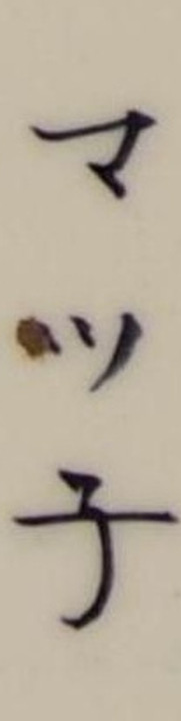マツ子
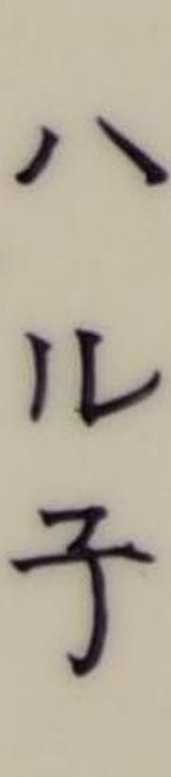ハル子
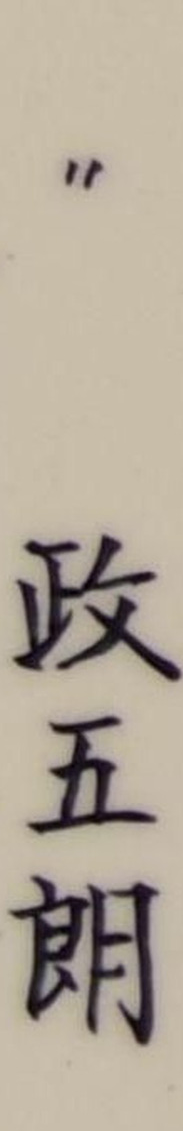政五朗
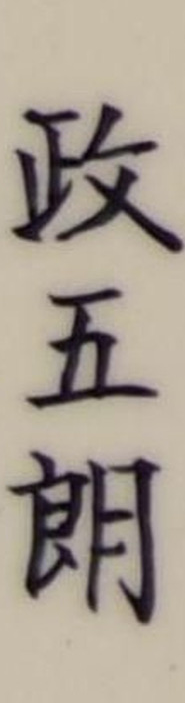政五朗
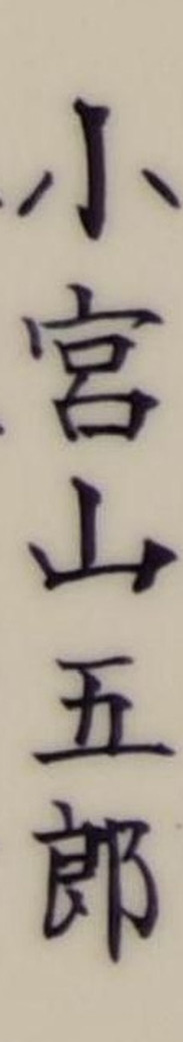小宮山五郎
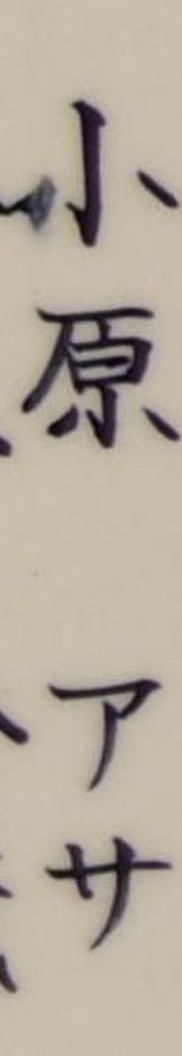小原アサ
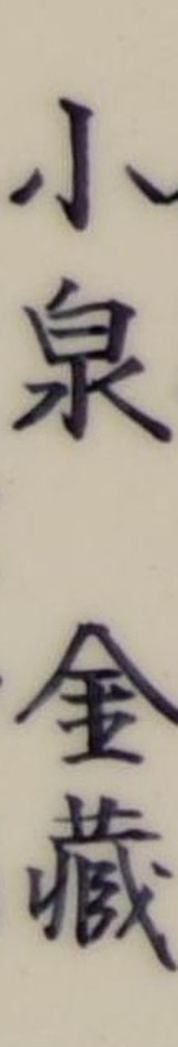小泉金蔵
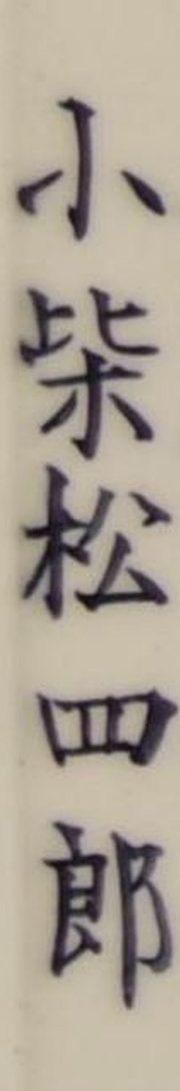小柴松四郎

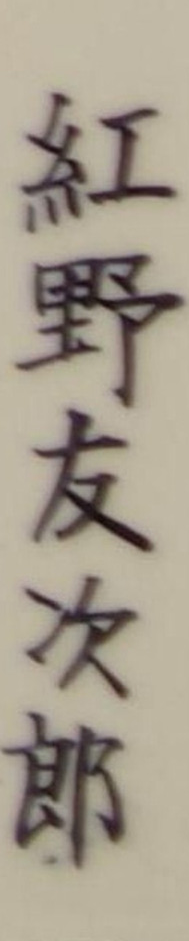紅野友次郎
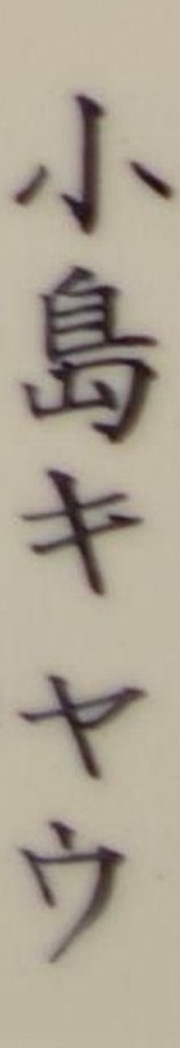小島キヤウ
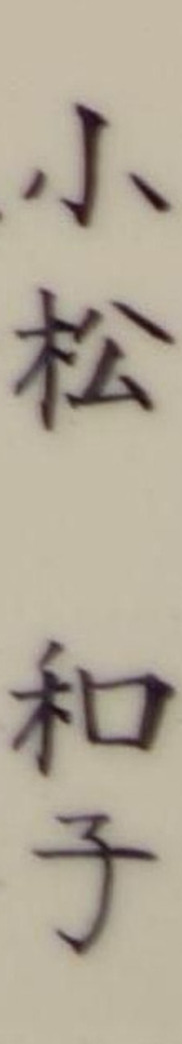小松和子
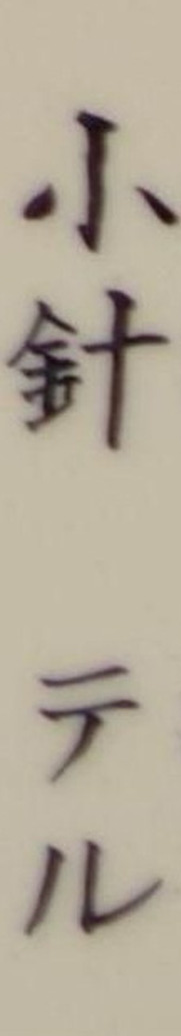小針テル
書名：M~S
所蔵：高野山金剛峯寺
